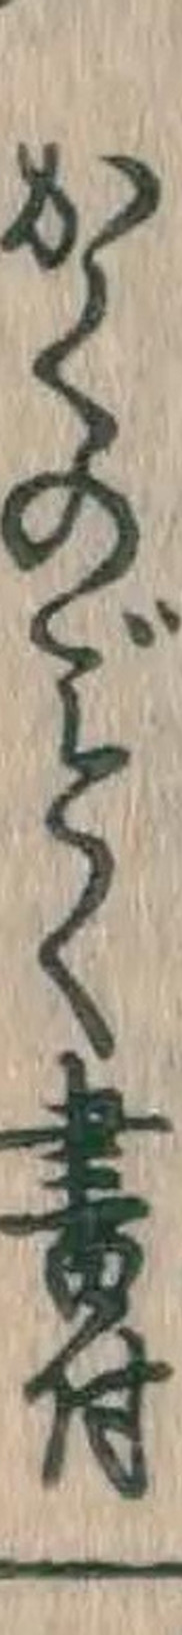かくのごとく書付
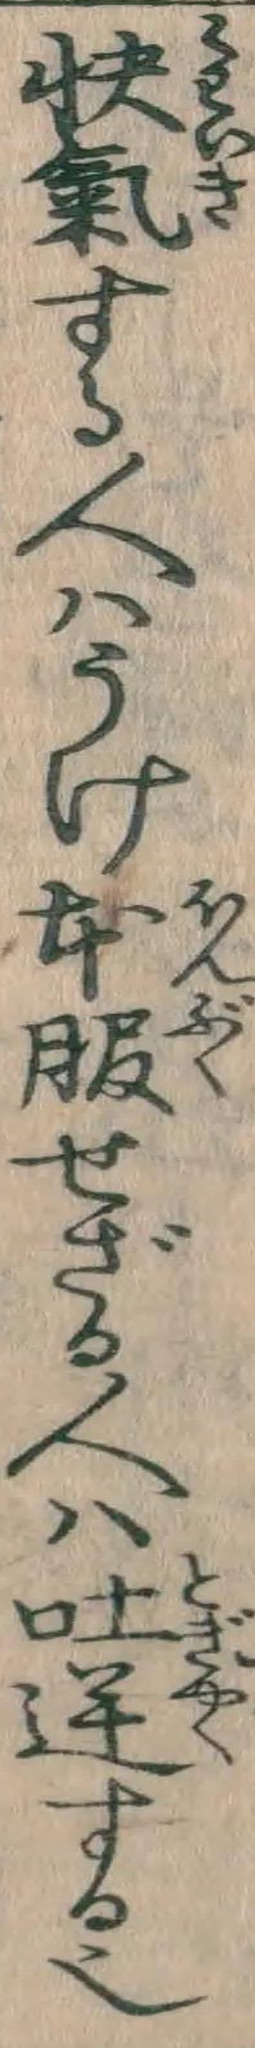快気する人はうけ本服せざる人は吐逆する也
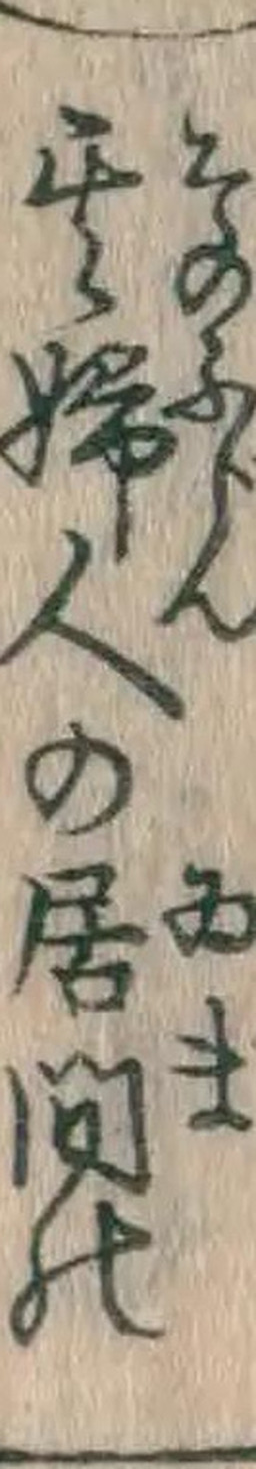其婦人の居間の
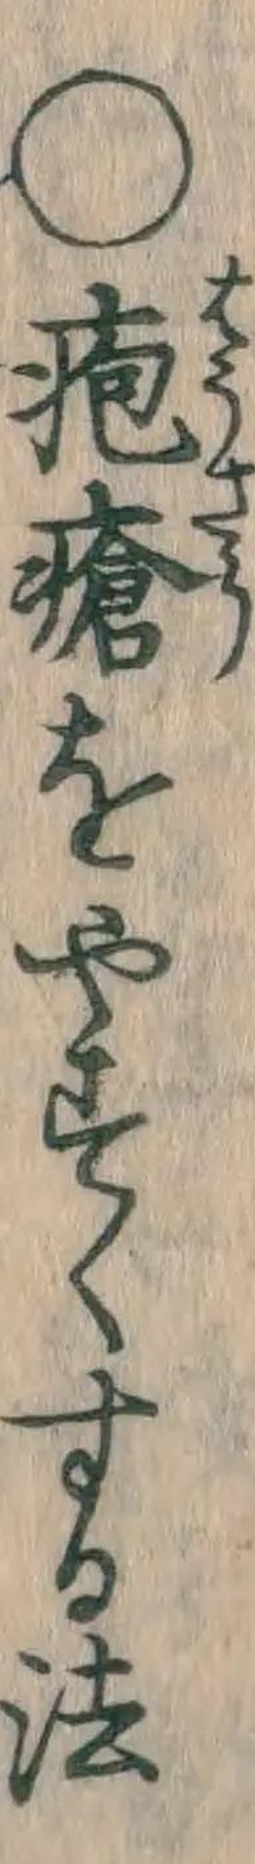○痘瘡をやすくする法
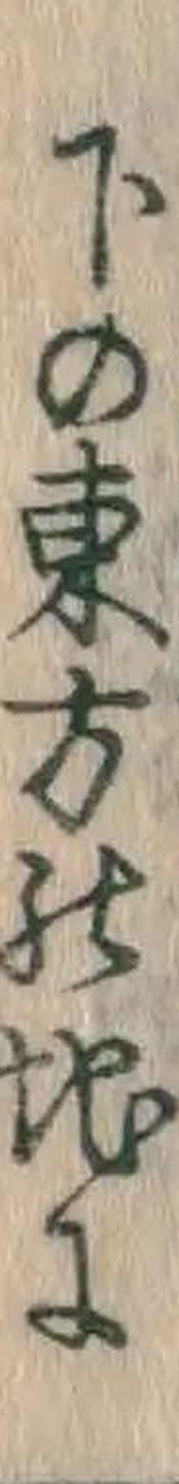下の東方の地に
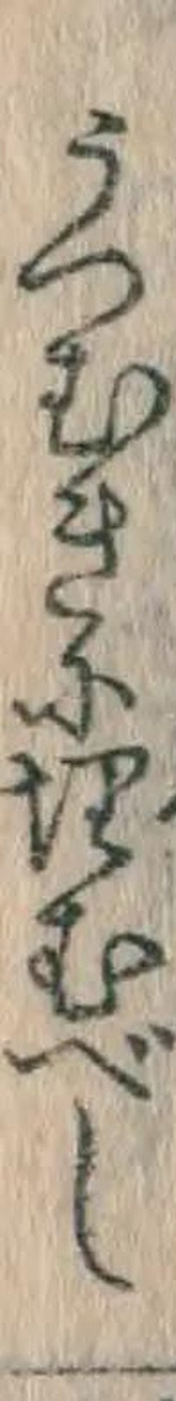うつむきに埋むべし
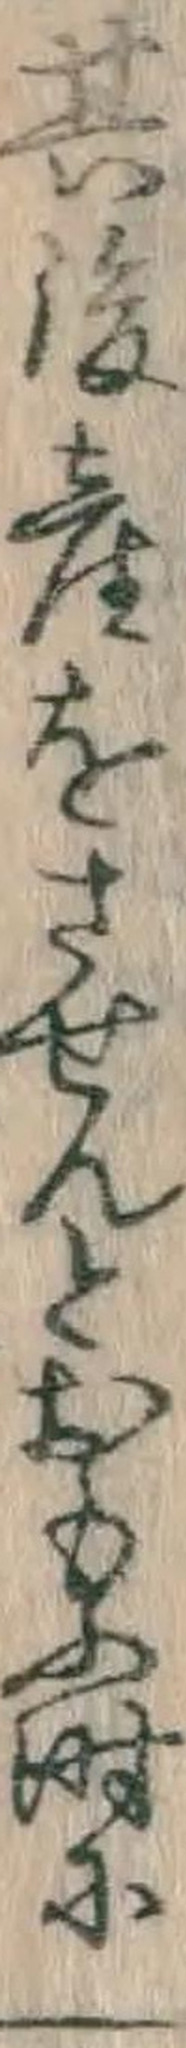其後産をさせんとおもふ時に
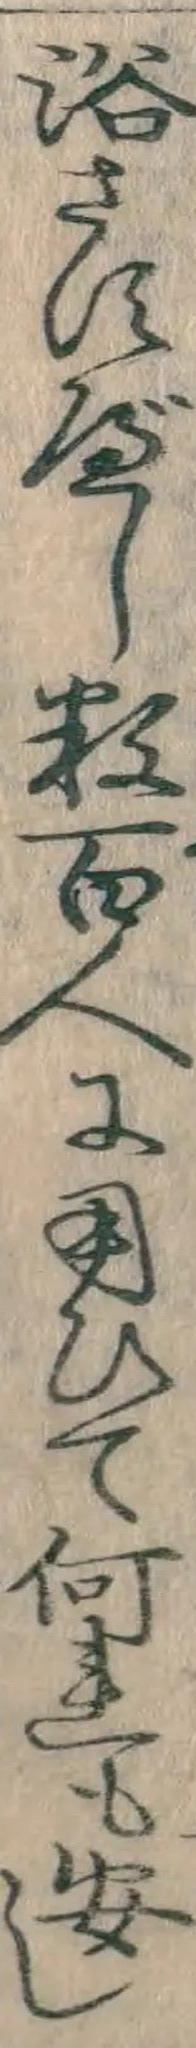浴さすべし数百人に用ひて何れも安し
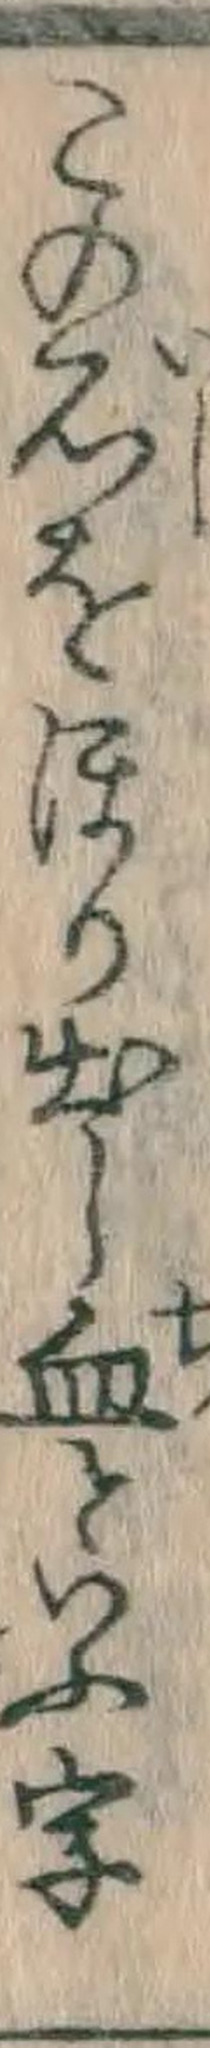この石をほり出し血といふ字
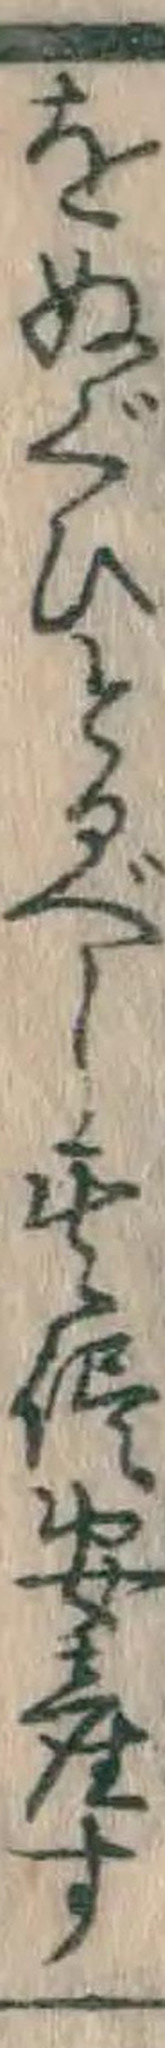をぬぐひとるべし其儘安産す
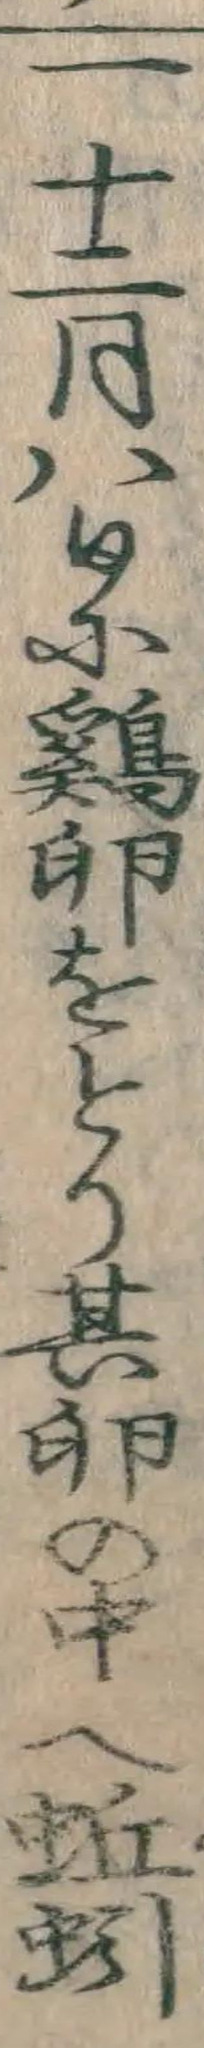一十二月八日に鶏卵をとり其卵の中へ蚯蚓
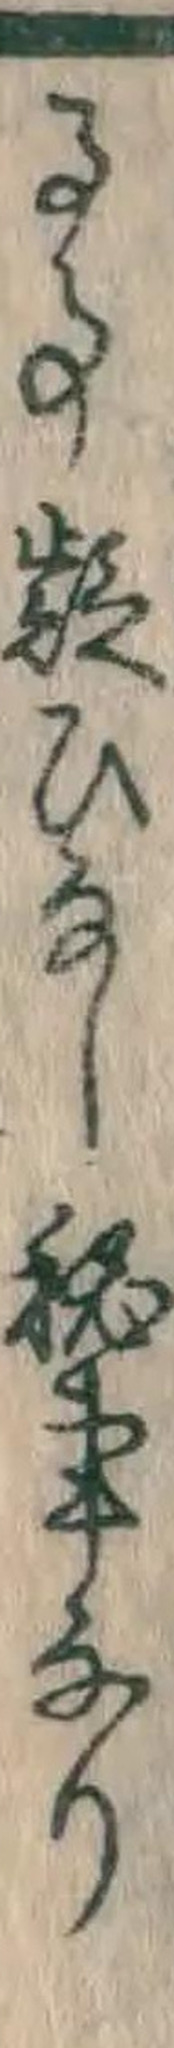る事疑ひなし秘事なり
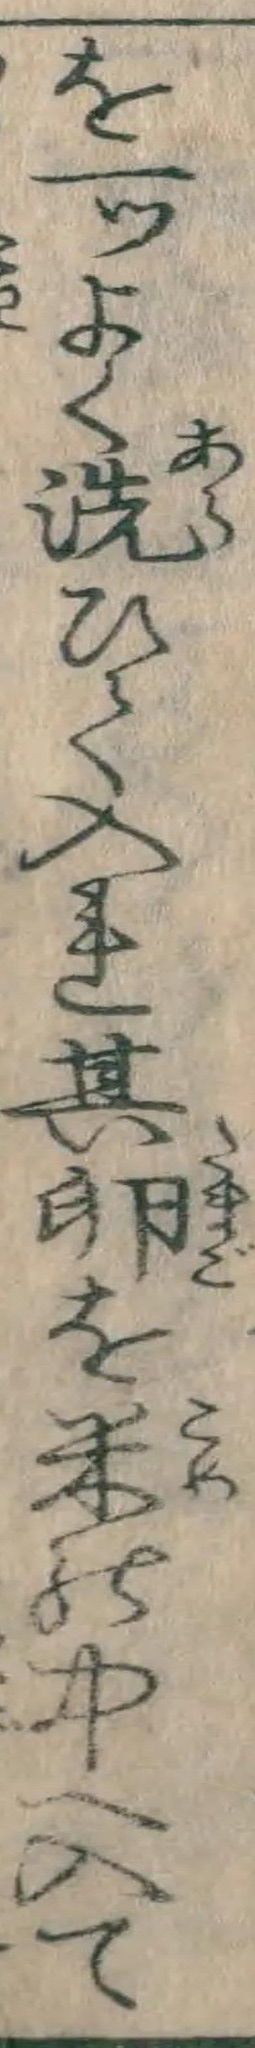を一ッよく洗ひて入れ其卵を米の中へ入て
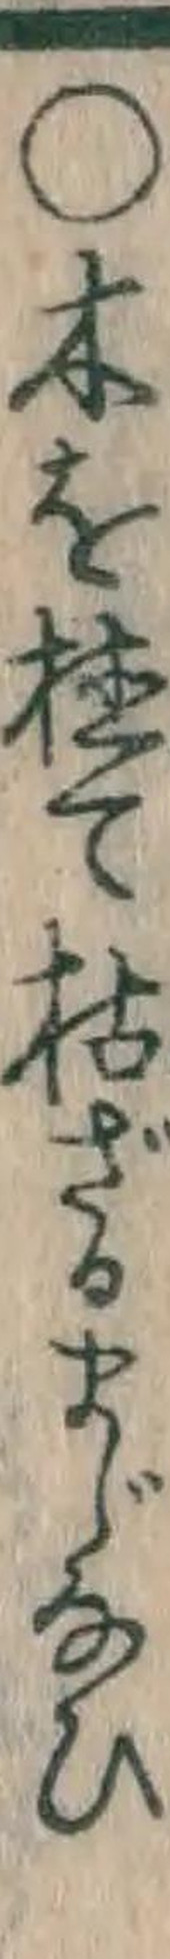○木を植て枯ざるまじなひ
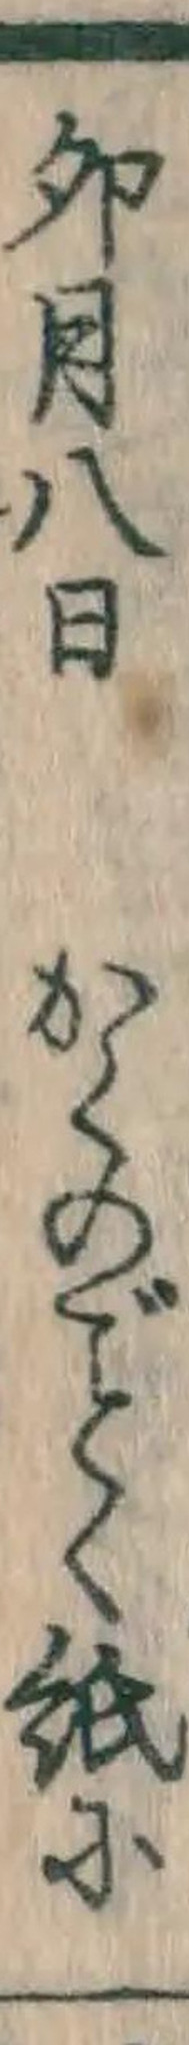卯月八日かくのごとく紙に
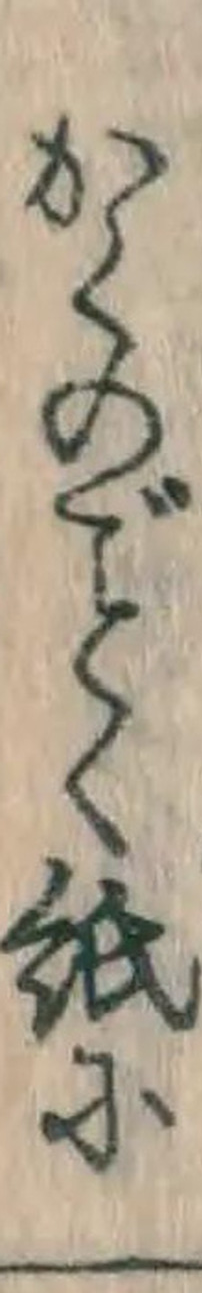かくのごとく書付
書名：広益秘事大全 3巻. [4]
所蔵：国立国会図書館 National Diet Library, JAPAN
